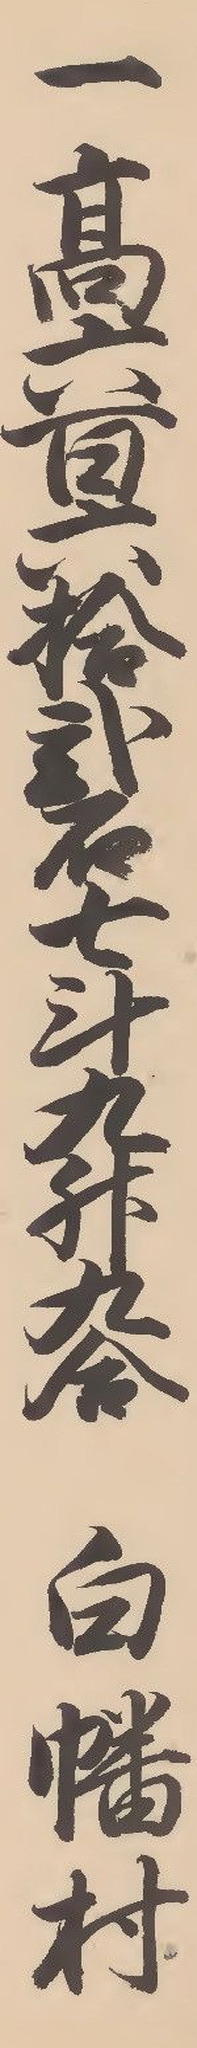一高六百六拾弐七斗九升九合白幡村
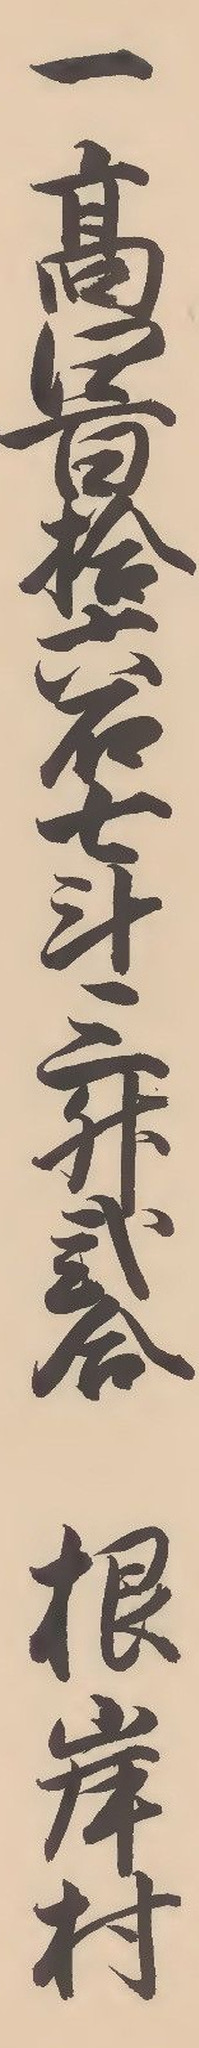一高四百拾六石七斗三升弐合根岸村
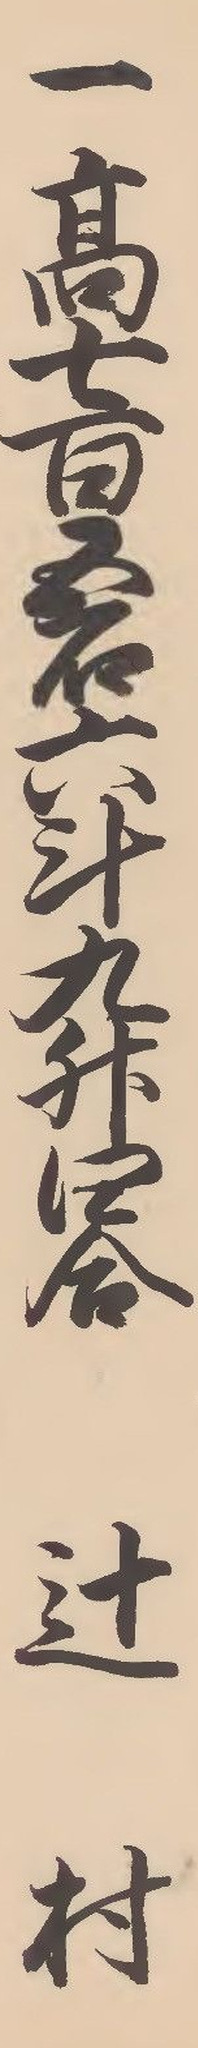一高七百五石六斗九升四合辻村
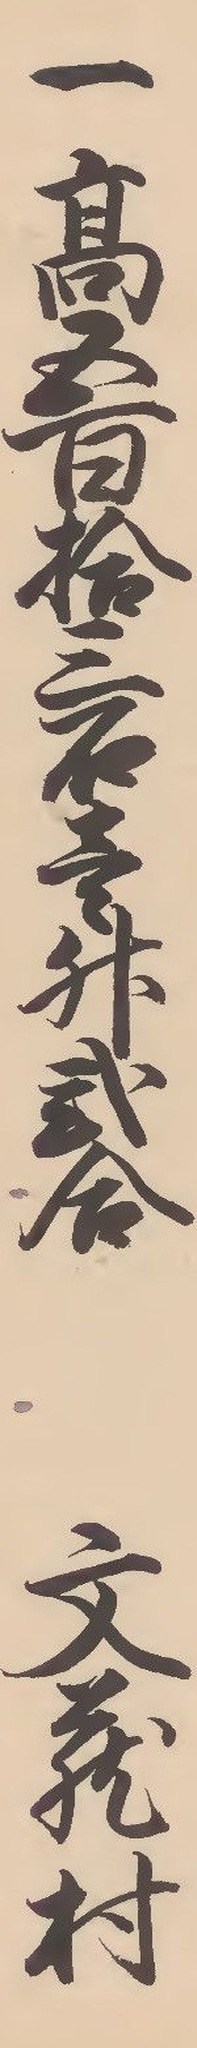一高五百拾三石壱升弐合文蔵村

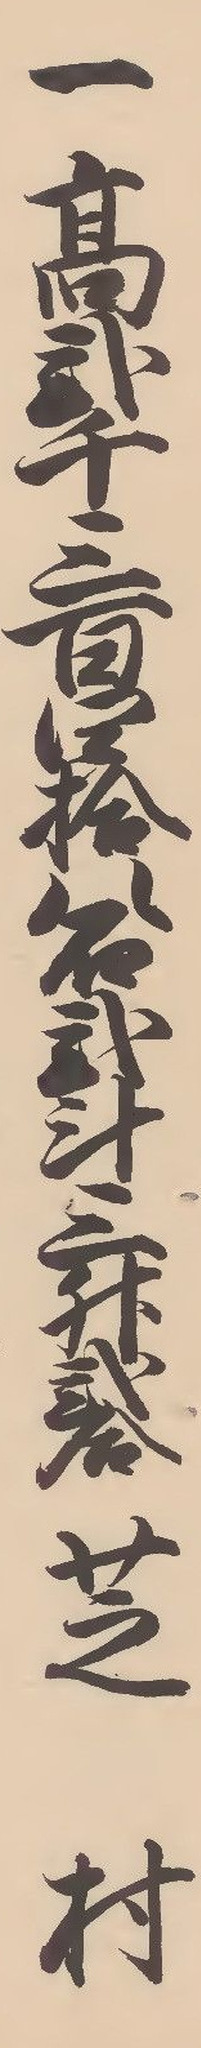一高弐千三百四拾八石弐斗三升弐合芝村
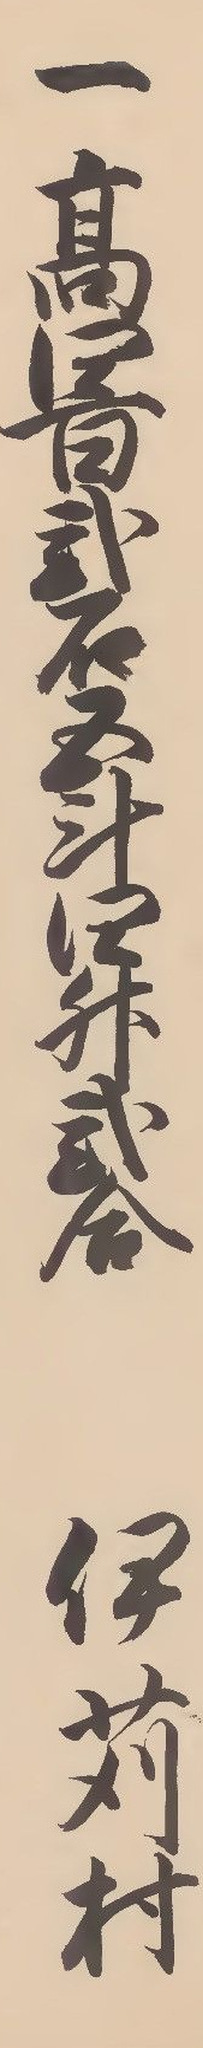一高四百弐石五斗四升弐合伊刈村
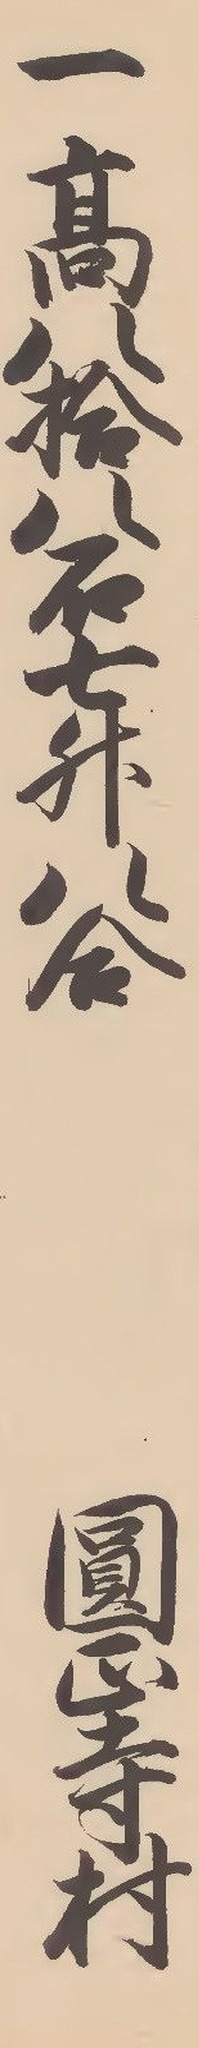一高八拾八石七升八合円正寺村
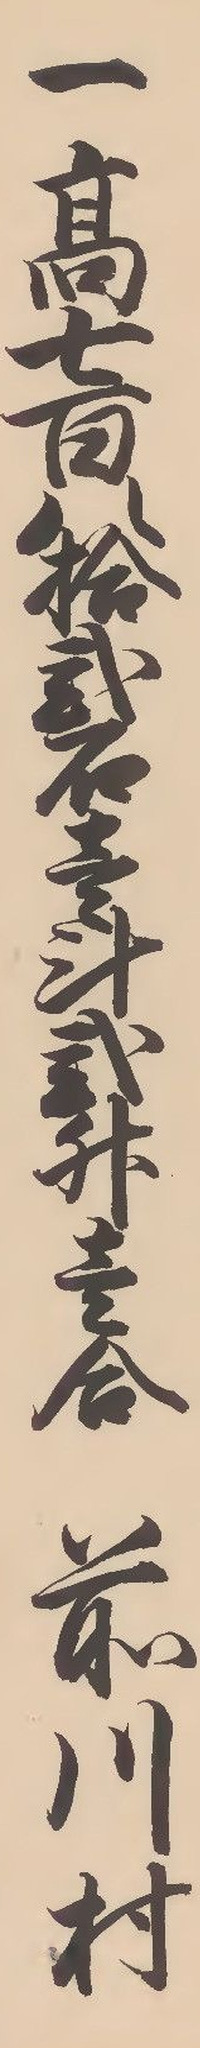一高七百八拾弐石壱斗弐升壱合前川村
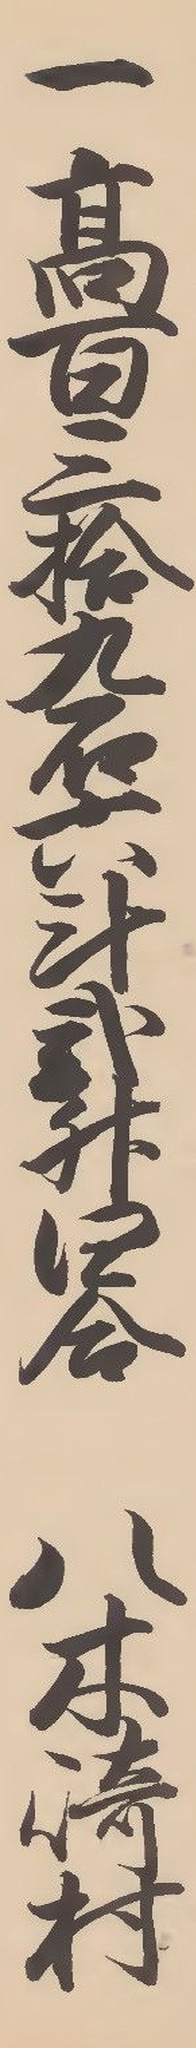一高百三拾九石六斗弐升四合八木崎村
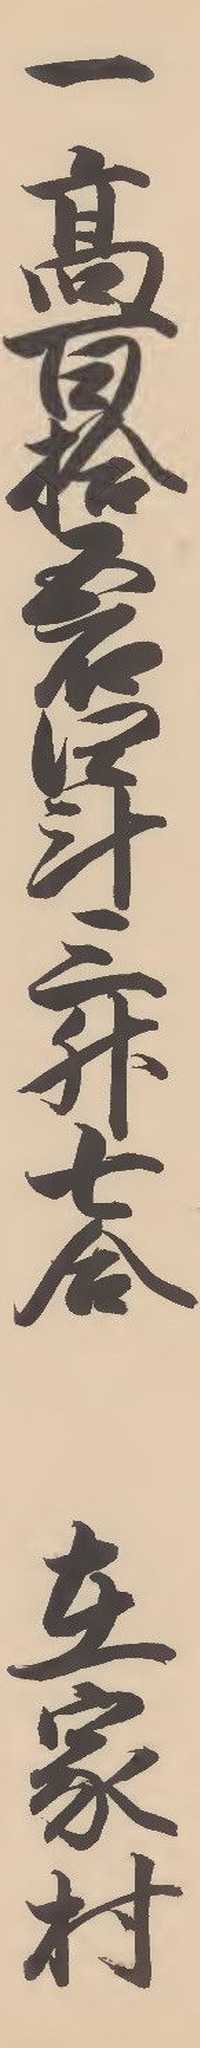一高百拾五石四斗三升七合在家村
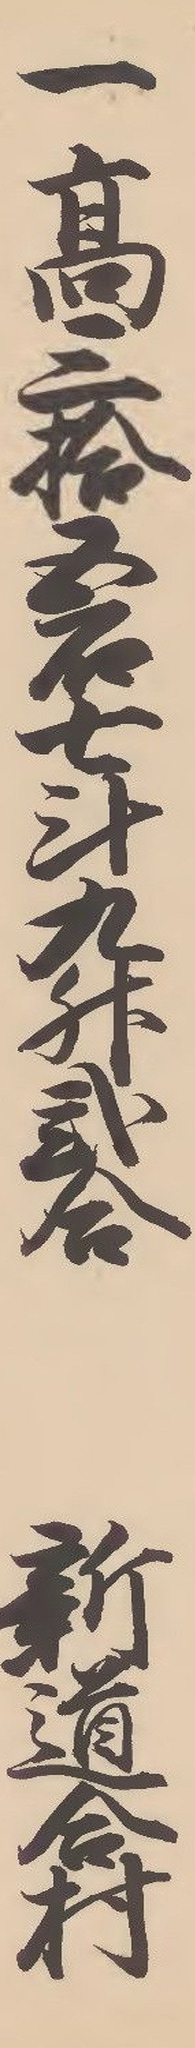一高三拾五石七斗九升弐合新道合村
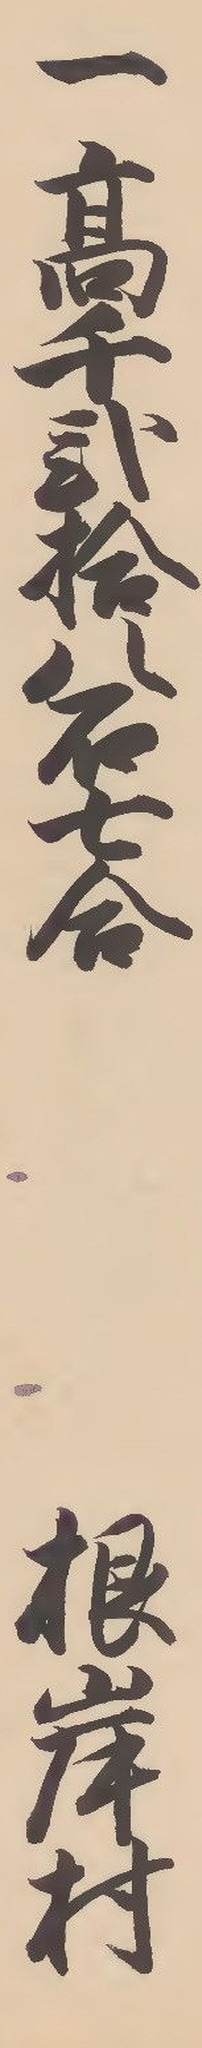一高千弐拾八石七合根岸村

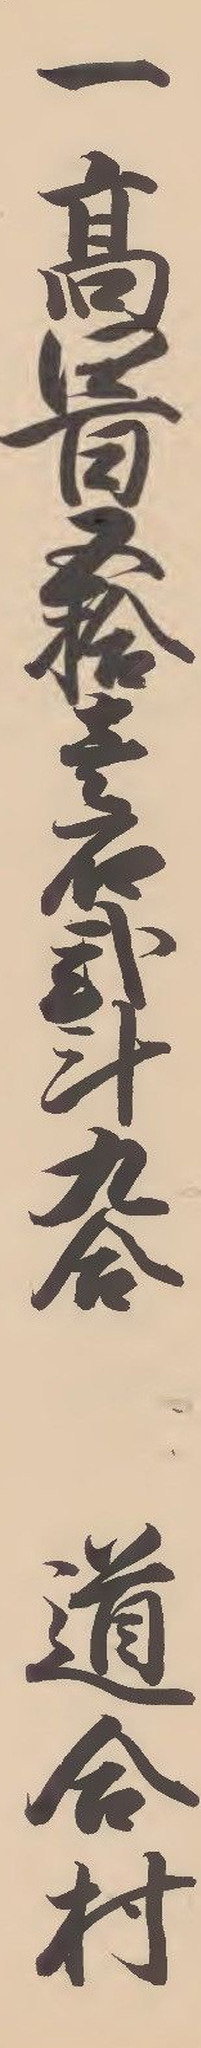一高四百五拾壱石弐斗九合道合村
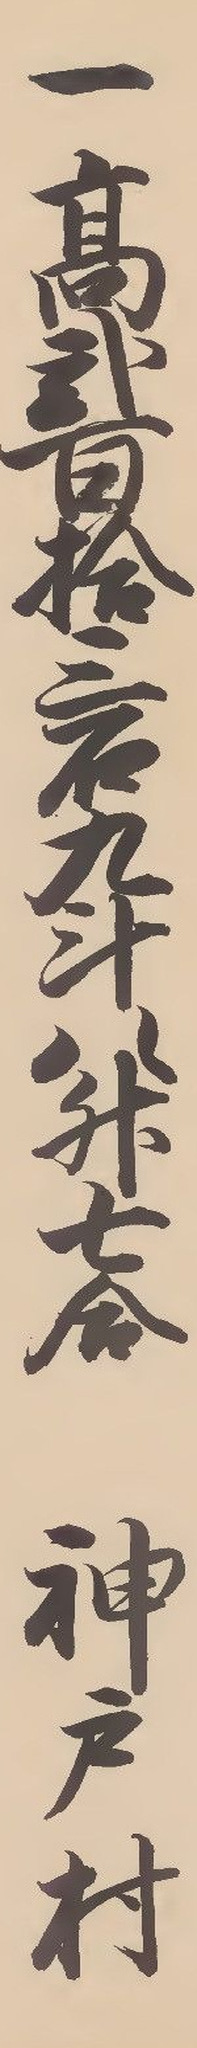一高弐百拾三石九斗八升七合神戸村
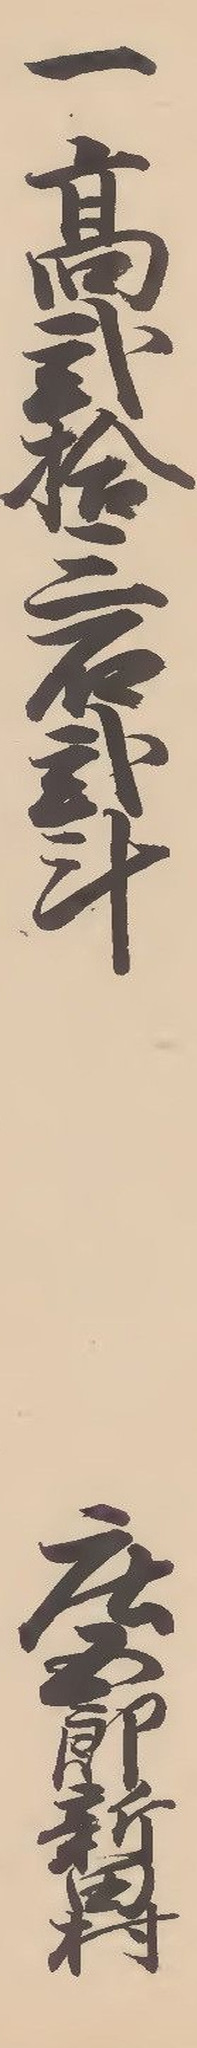一高弐拾三石弐斗庄五郎新田村
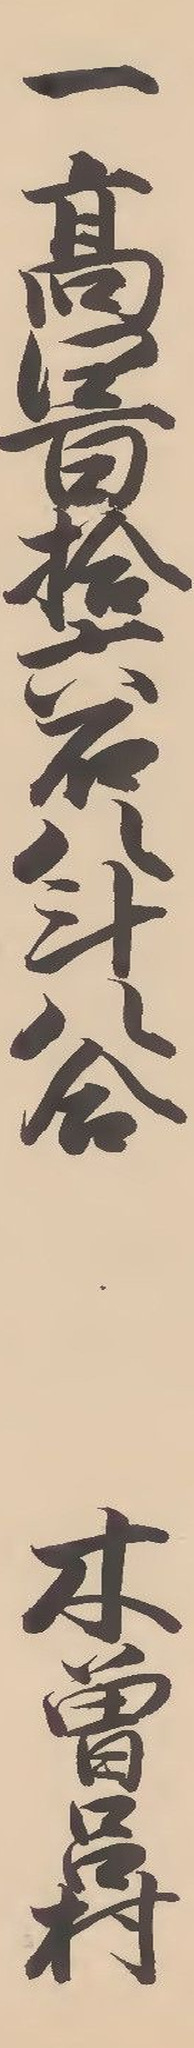一高四百拾六石八斗八合木曽呂村
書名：武蔵国郷帳　下
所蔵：国立公文書館 National Archives of Japan
